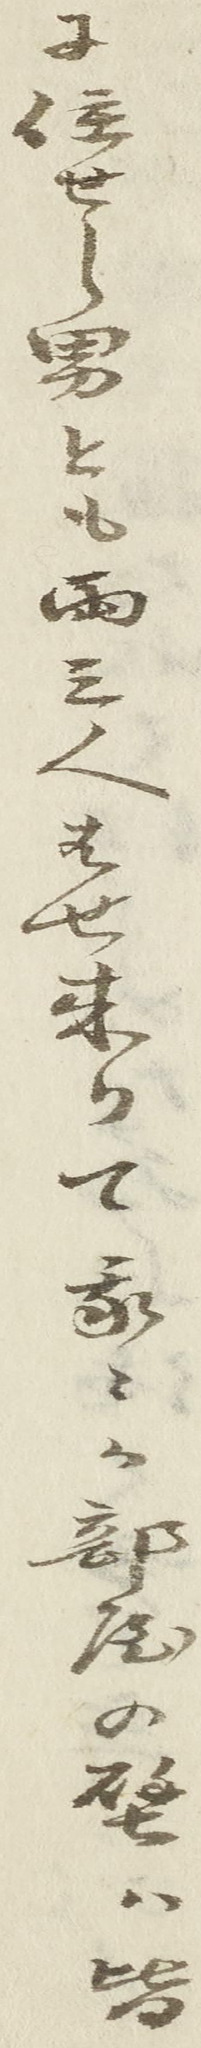に住せし男とも両三人はせ来りて我々か部屋の壁ハ皆
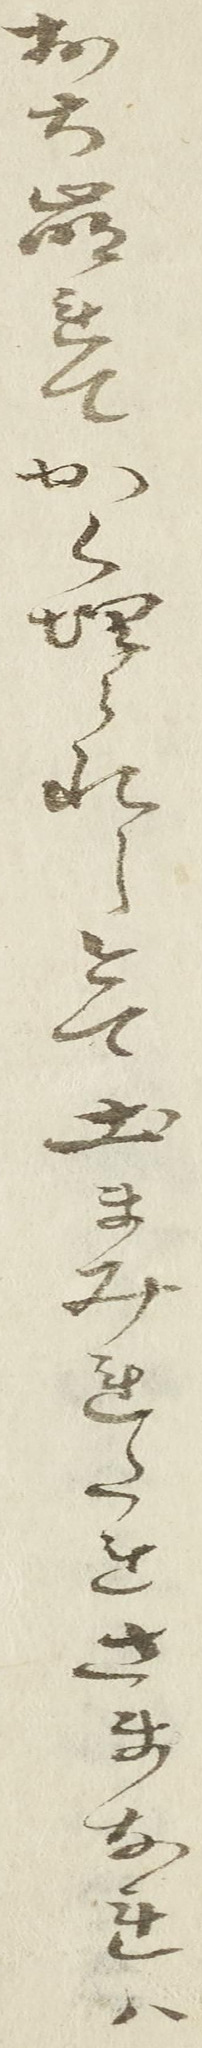おち崩れてかく埋られしとて土まみれたれさまなれハ
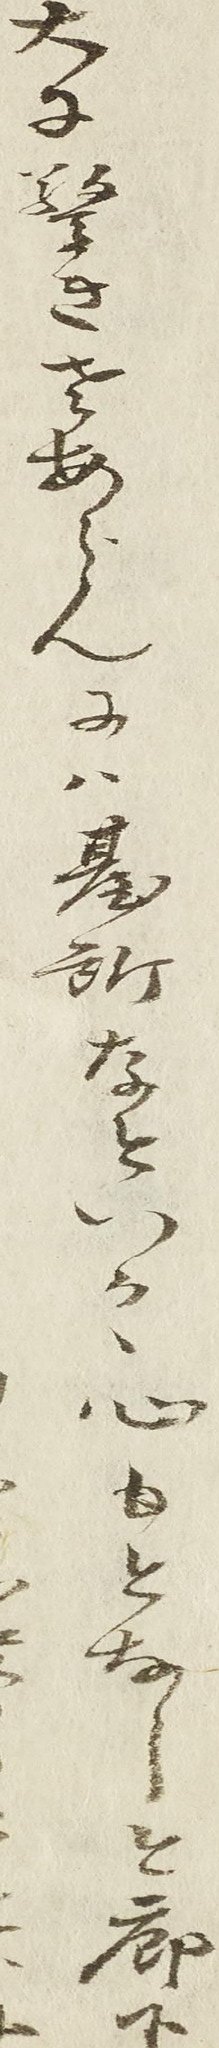大に驚きさあらんには台所なといかゝ心もとなしと廊下
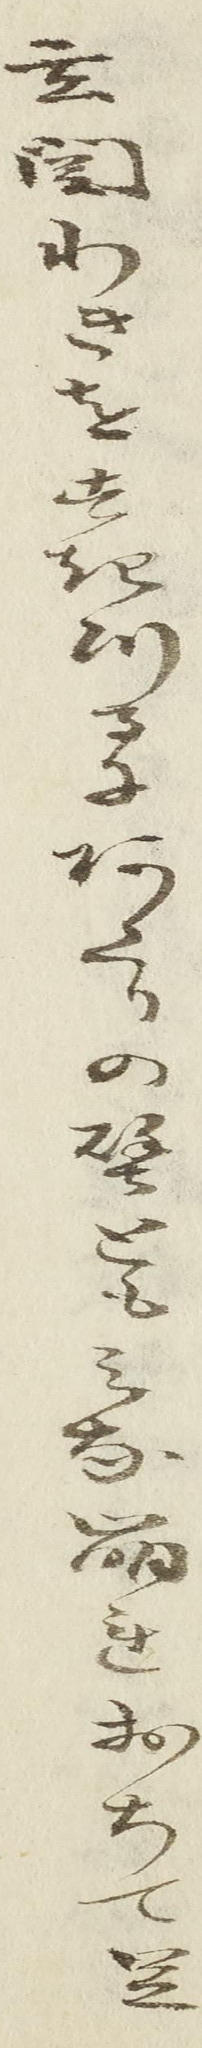玄関わきをすきつるにあたりの壁ともミな崩れおちて足
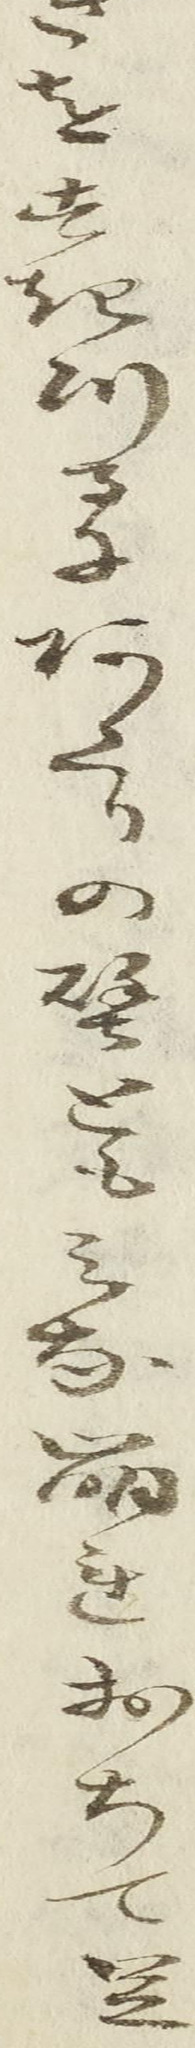玄関わきをすきつるにあたりの壁ともミな崩れおちて足
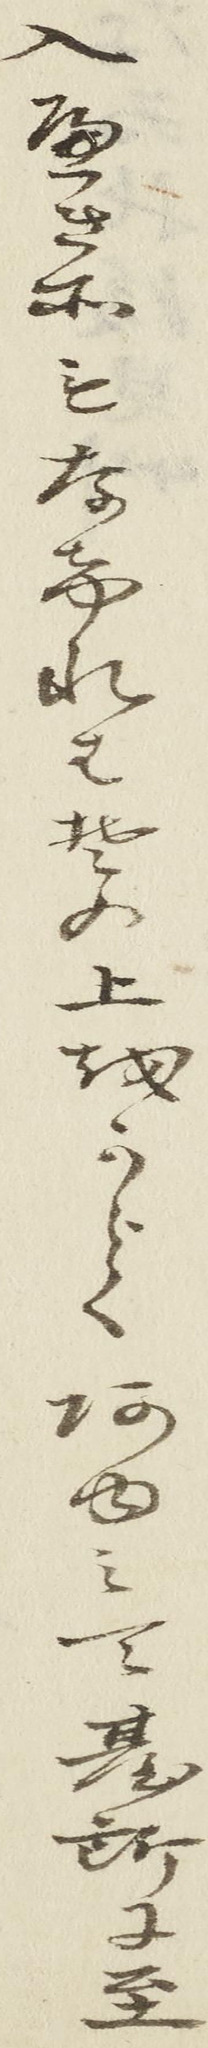入へき所もなけれはその上をからくあゆミて台所に至
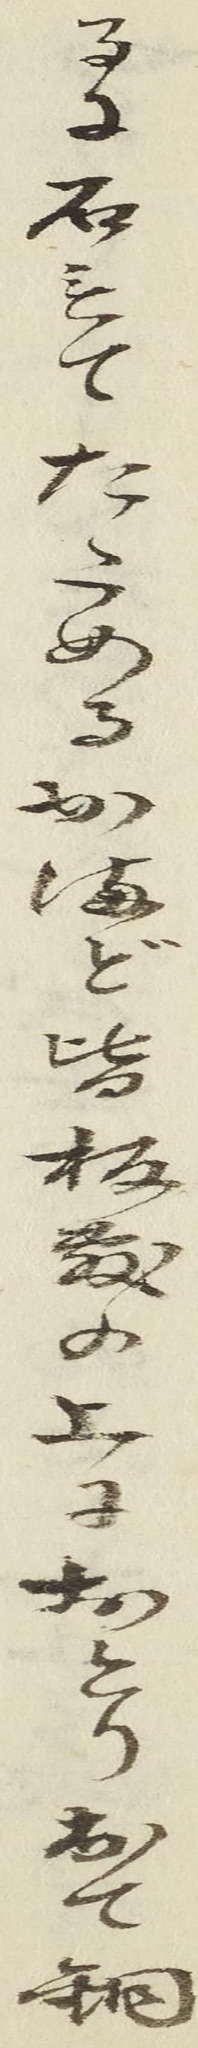るに石もてたためる出まど皆板敷の上におとり出て銅
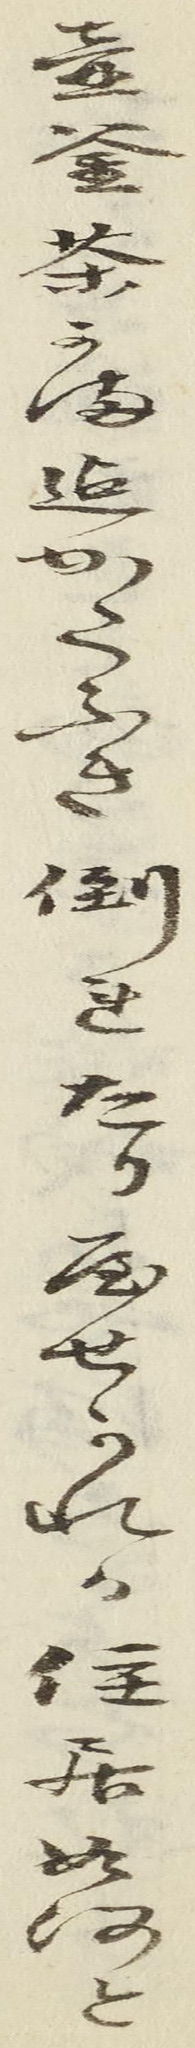壺釜茶かま迄かたふき倒れたりやせかれか住居如何と
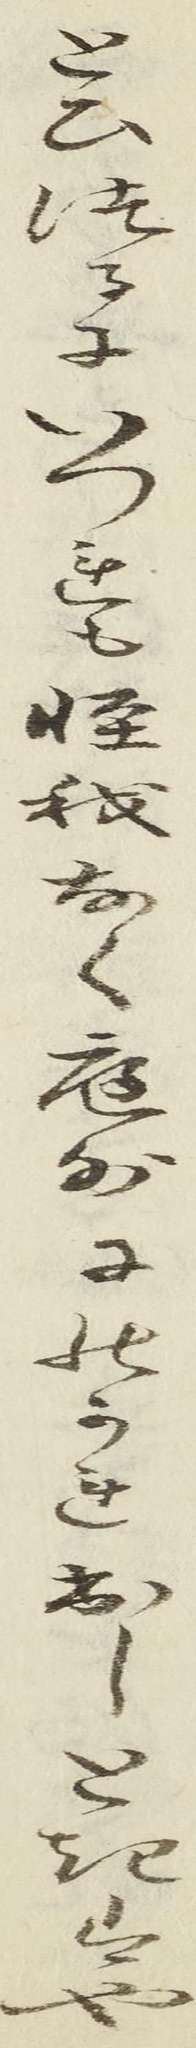とひつるにいつれも怪我なく庭前にのかれ出しときはや
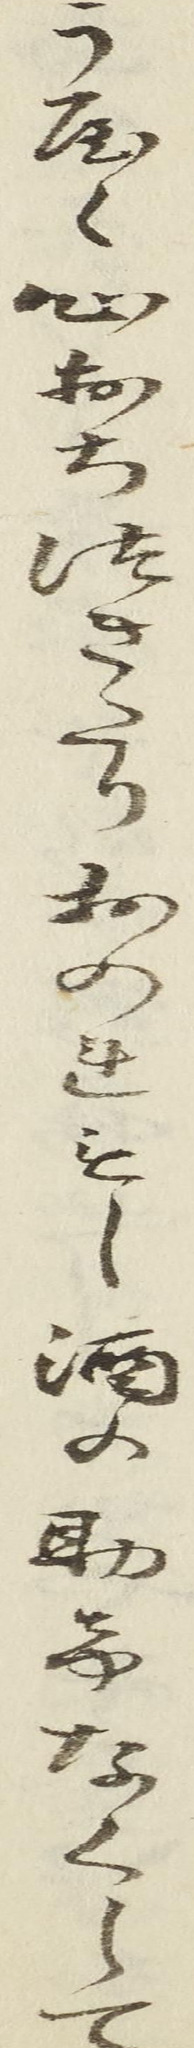うやく心おちつきたりおのれもし酒の助けなくして
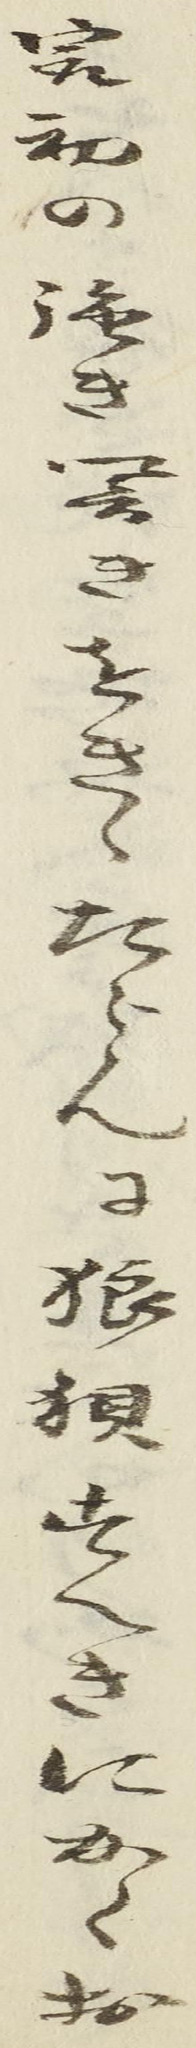最初の強き響きをきゝたらんに狼狽すへきにかくお
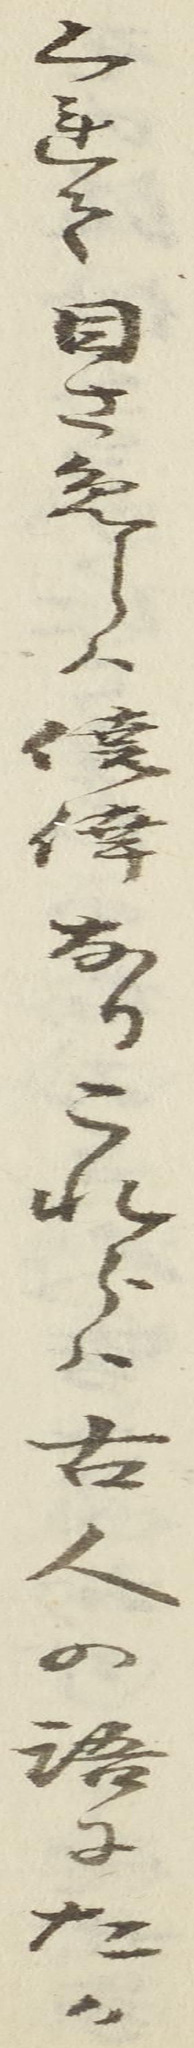くれて目さましハ僥倖なりこれらハ古人の語にたか
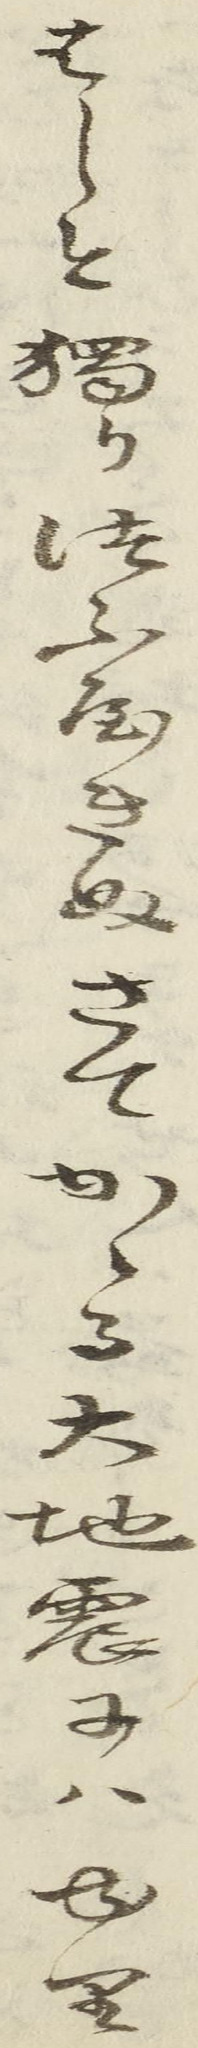はしと独りつふやきぬさてかゝる大地震にハゆり
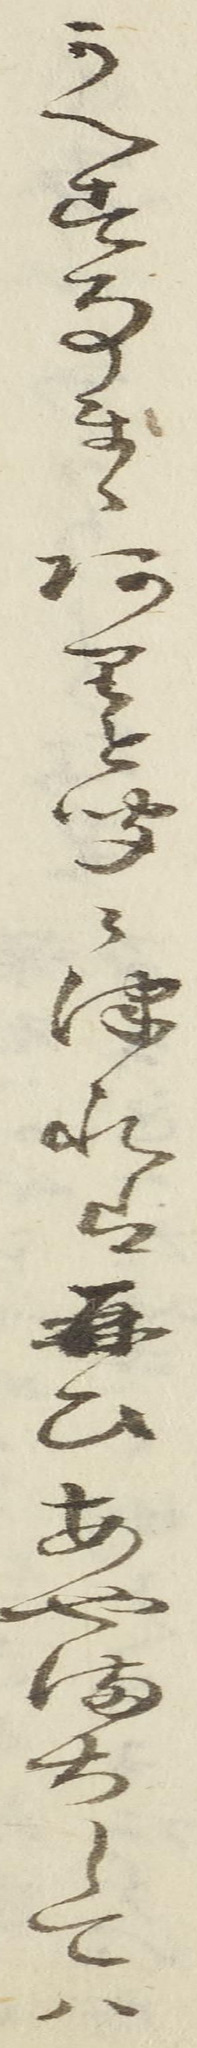かへす事まゝありと聞々つれは再ひあやまちしてハ
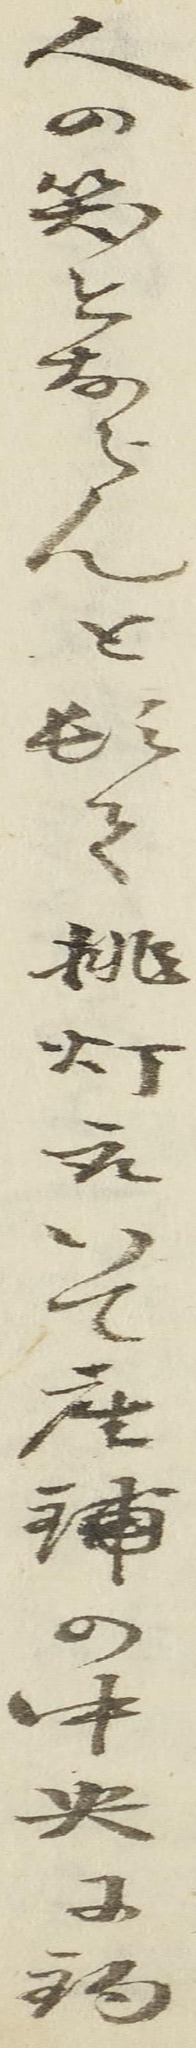人の笑とならんと頓て提灯取いて座鋪の中央に釣
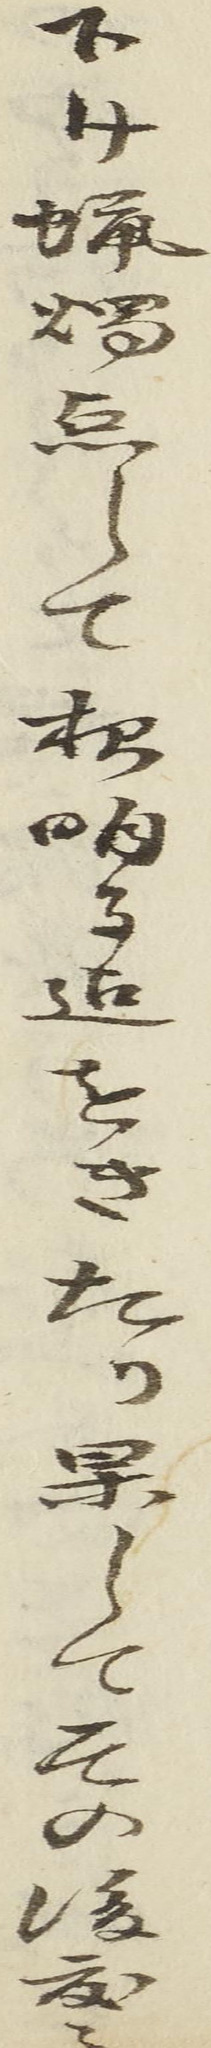下け蝋燭点して夜明る迄をきたり果してその後度々
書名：那為の後見艸　全
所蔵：東京大学地震研究所図書室 Earthquake Research Institute Library, The University of Tokyo, JAPAN
